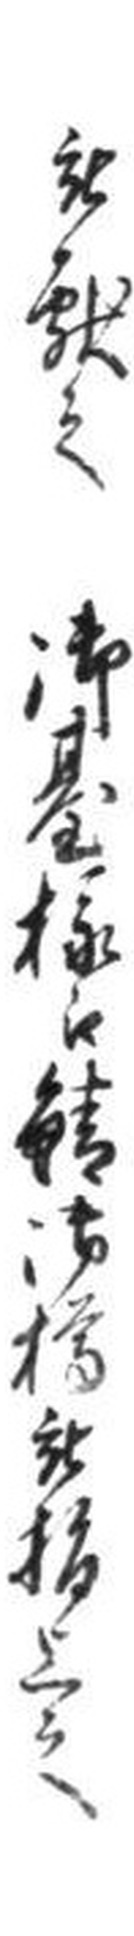被献之御台様江鯖御樽被指上之
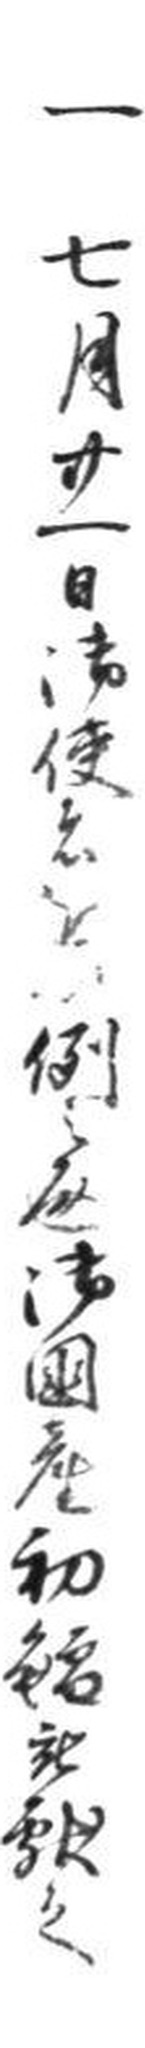一七月廿一日御使者を以例之通御国産初鱈被献之
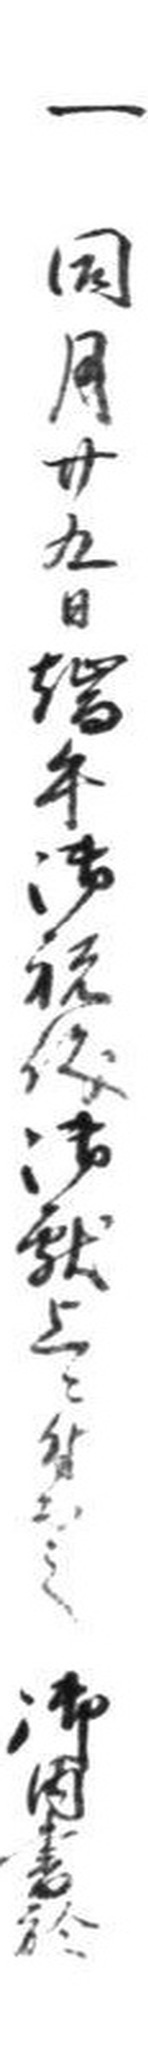一同月廿九日端午御祝儀御献上ニ付而之御内書於
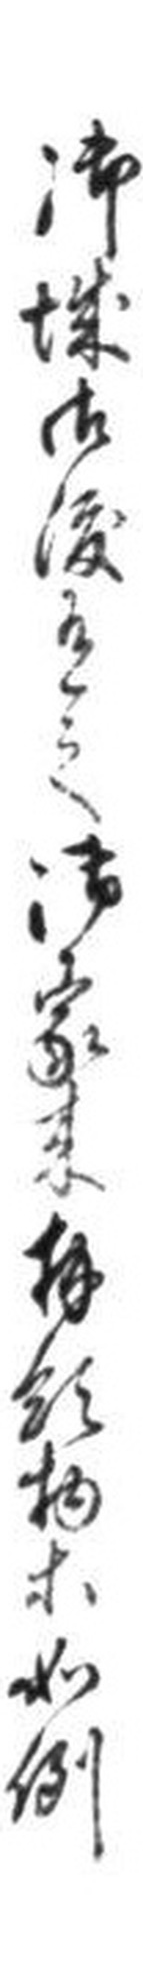御城御渡有之御家来拝領物等如例
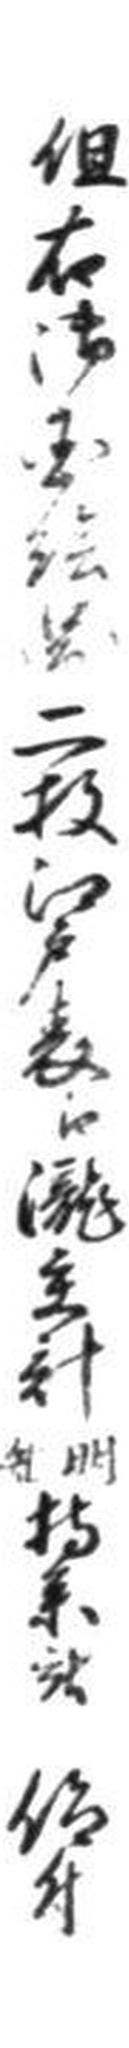但右御国絵図二枚江戸表江瀧主計明矩持参被仰付
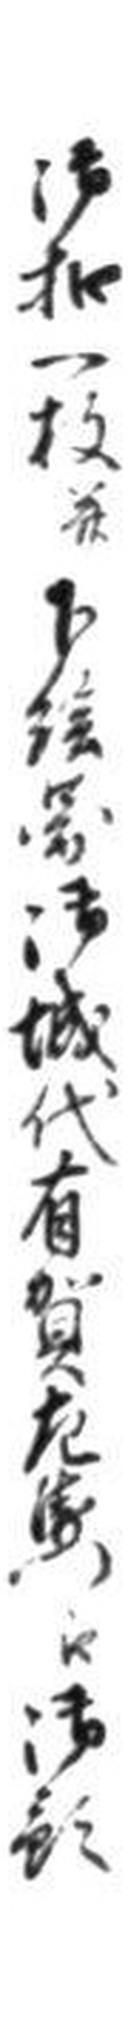御扣一枚并下絵図御城代有賀左衛門江御預
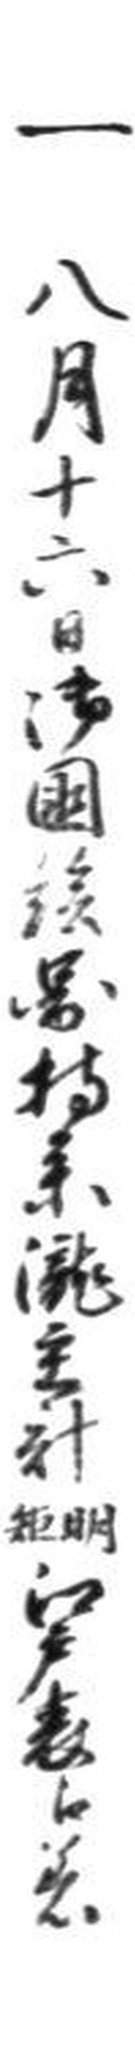一八月十六日御国絵図持参瀧主計明矩江戸表江着
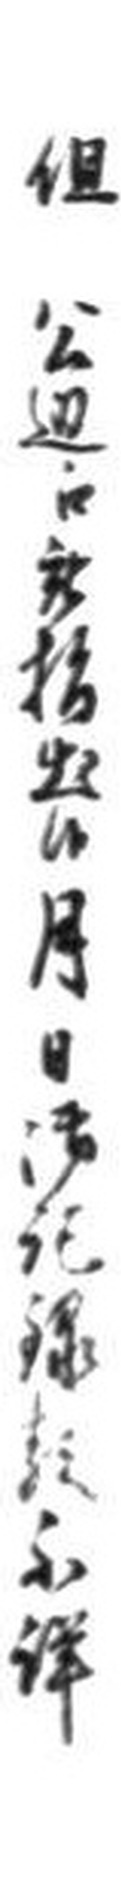但公辺江指出候月日御記録類不詳
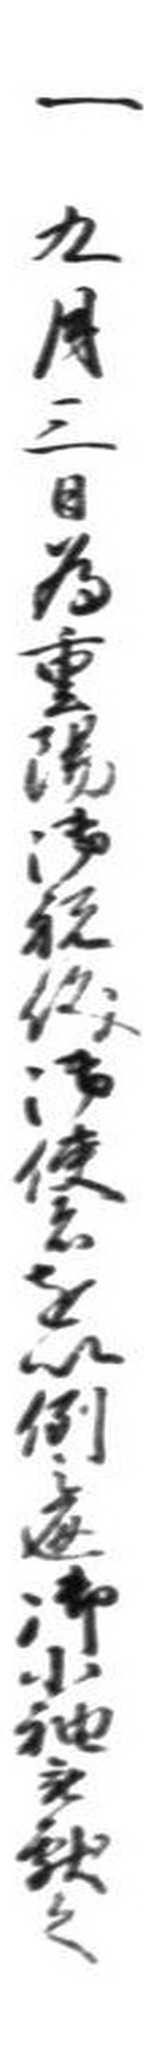一九月三日為重陽御祝儀御使者を以例之通御小袖被献之
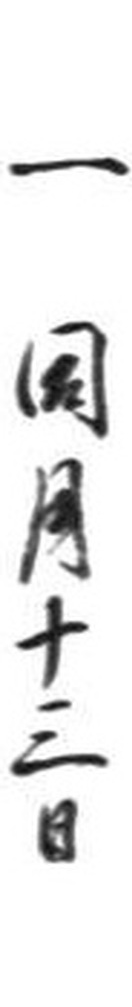一同月十三日
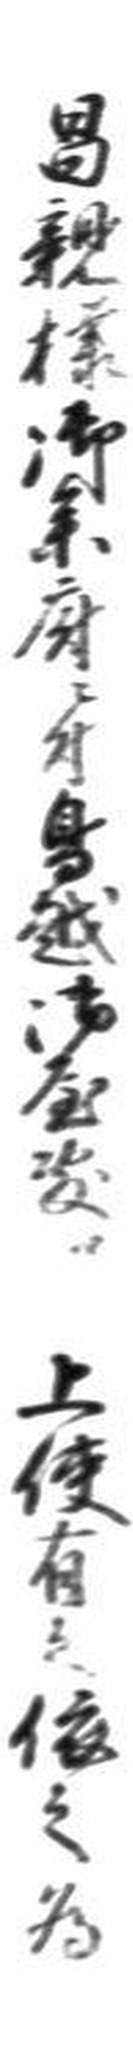昌親様御参府ニ付鳥越御屋敷江上使有之依之為
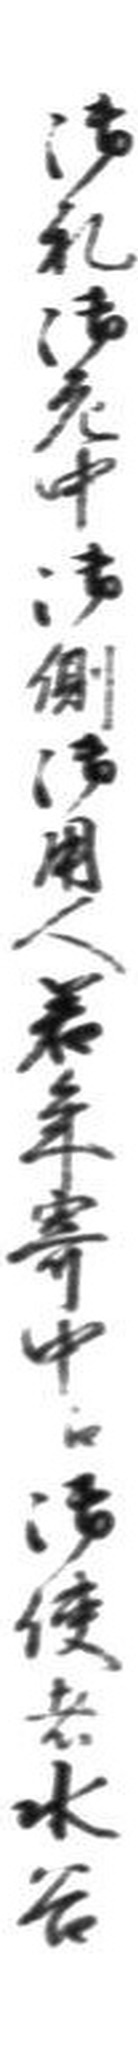御礼御老中御側御用人若年寄中江御使者水谷
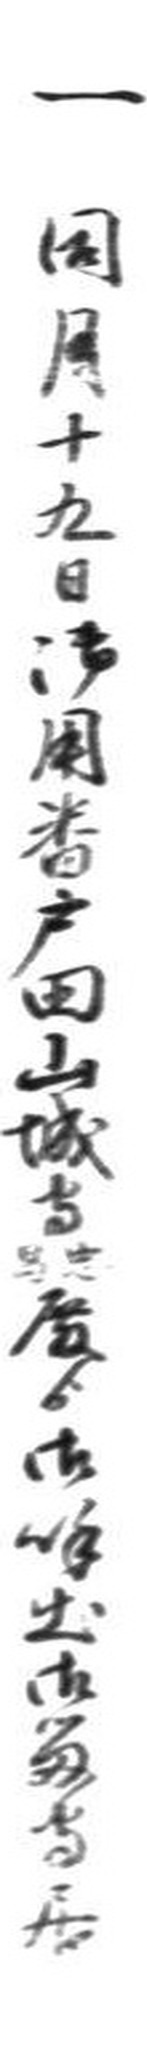一同月十九日御用番戸田山城守忠昌殿ゟ御呼出御留守居
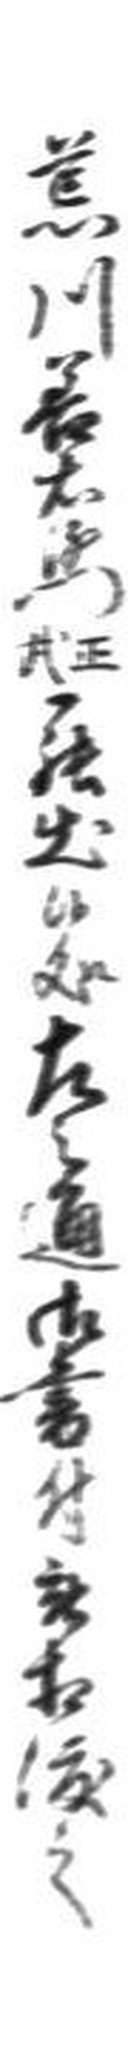荒川善右衛門正武罷出候処左之通御書付被相渡之
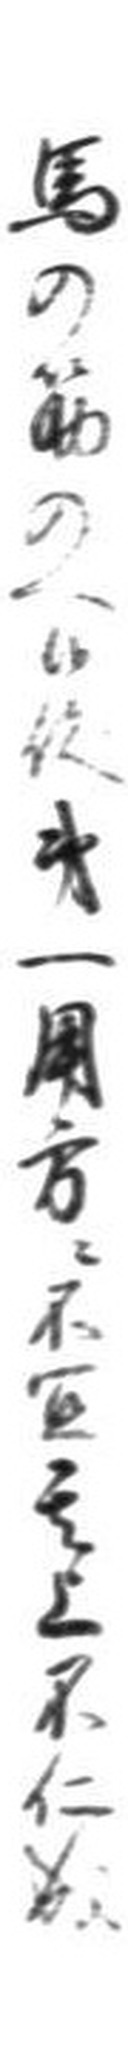馬の筋のへ候儀第一用方ニ不宜其上不仁成

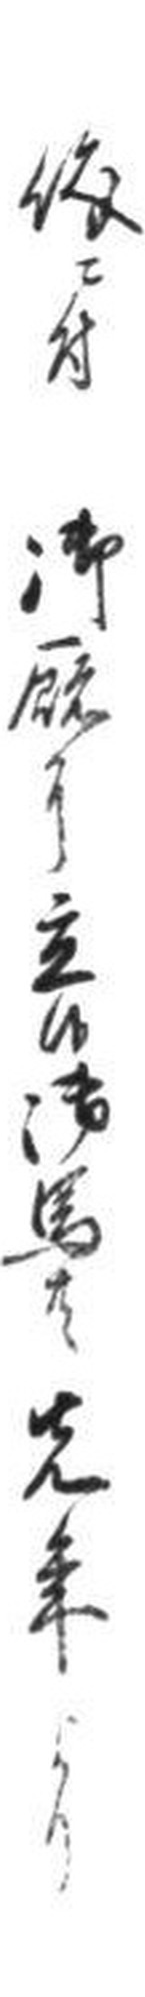儀ニ付御厩に立候御馬共先年より
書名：家譜 十五 綱昌公 従天和元年到元禄十二年
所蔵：福井県文書館 Fukui Prefectural Archives
